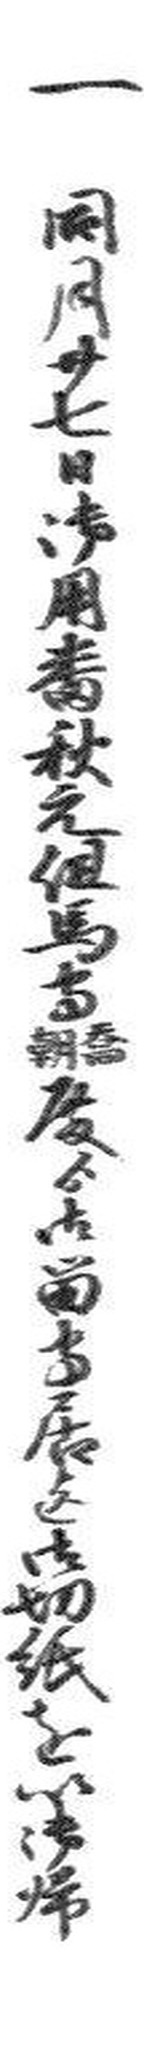一同月廿七日御用番秋元但馬守喬朝殿ゟ御留守居迄御切紙を以御帰
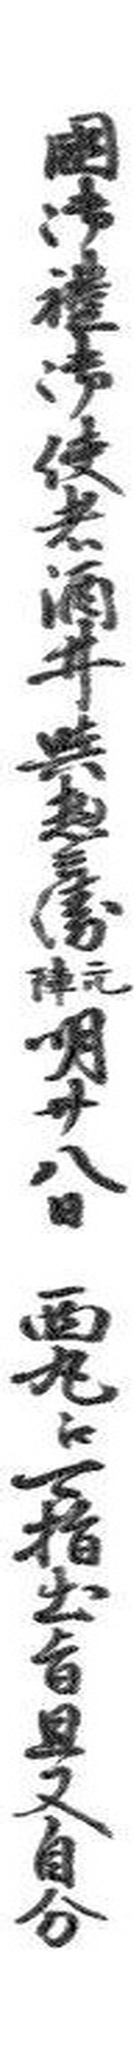国御礼御使者酒井與惣兵衛元陣明廿八日西丸江可指出旨且又自分
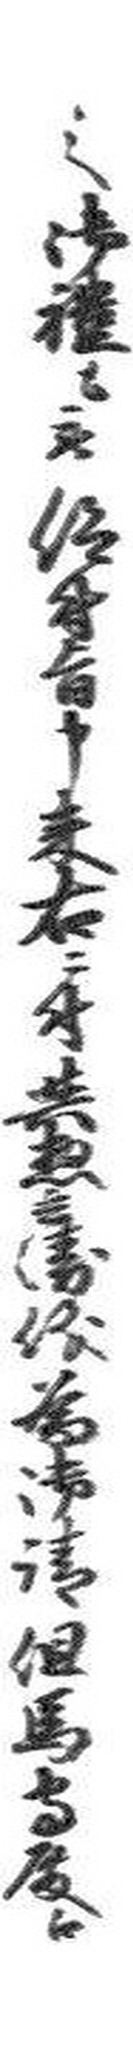之御礼も被仰付旨申来右ニ付與惣兵衛儀為御請但馬守殿江

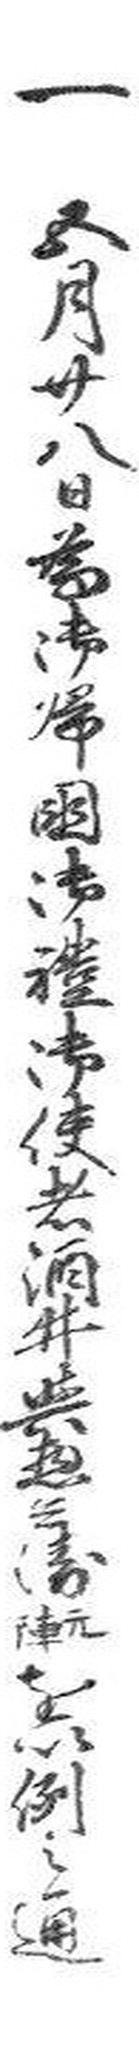一五月廿八日為御帰国御礼御使者酒井與惣兵衛元陣を以例之通
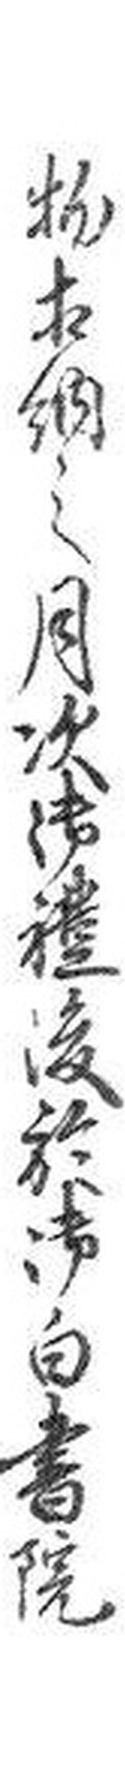物相納之月次御礼後於御白書院
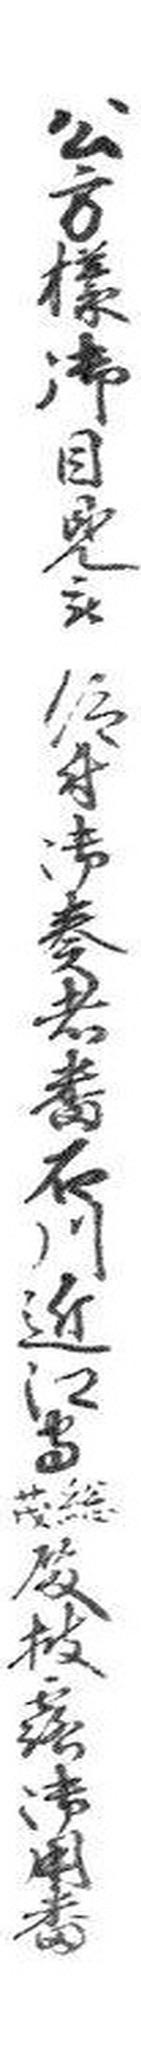公方様御目見被仰付御奏者番石川近江守総茂殿披露御用番
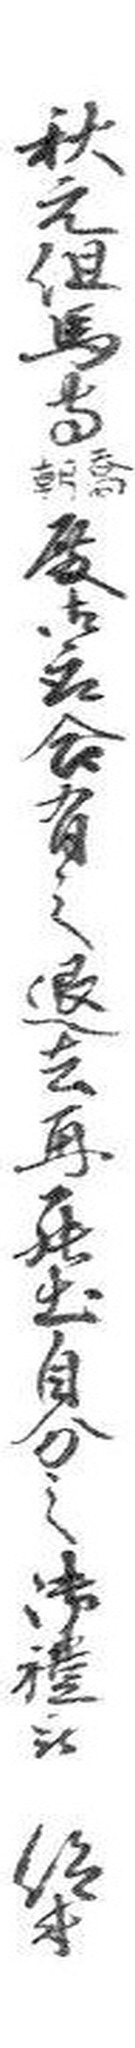秋元但馬守喬朝殿御取合有之退去再罷出自分之御礼被仰付
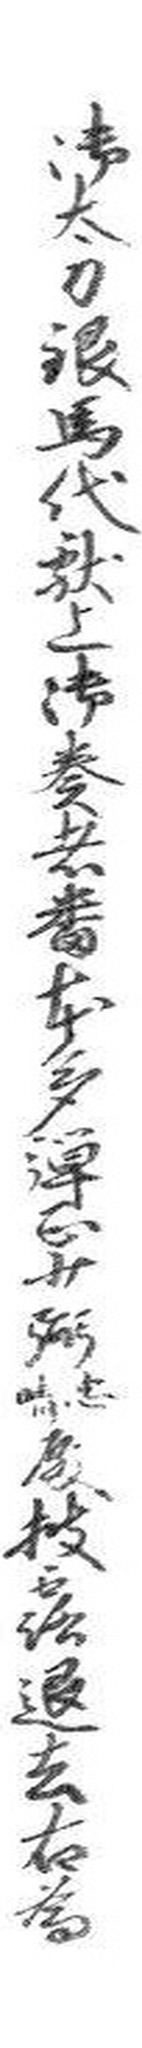御太刀銀馬代献上御奏者番本多弾正弼忠晴殿披露退去右為
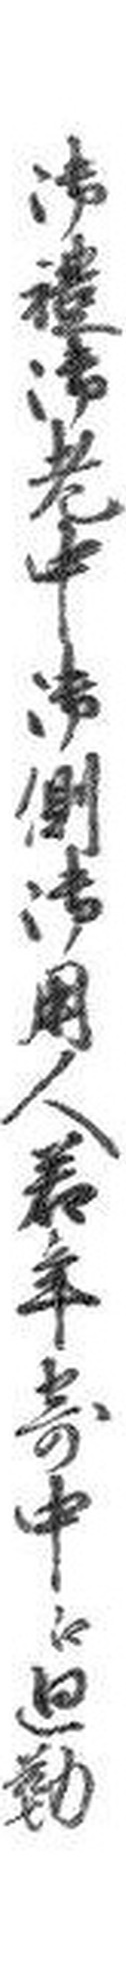御礼御老中御側御用人若年寄中江廻勤
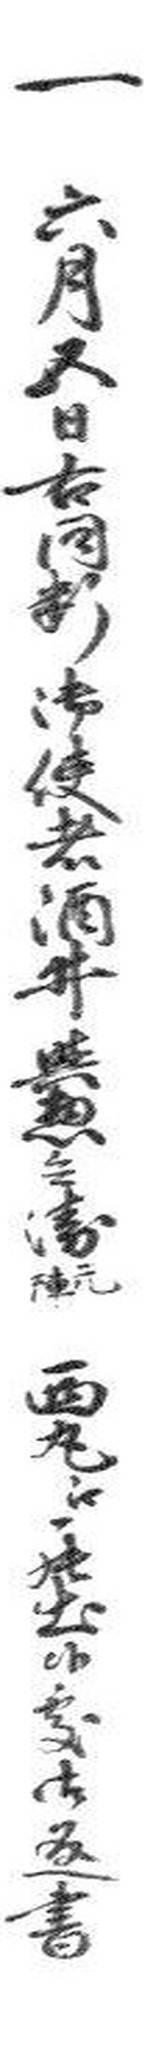一六月五日右同断御使者酒井與惣兵衛元陣西丸江罷出候処御返書
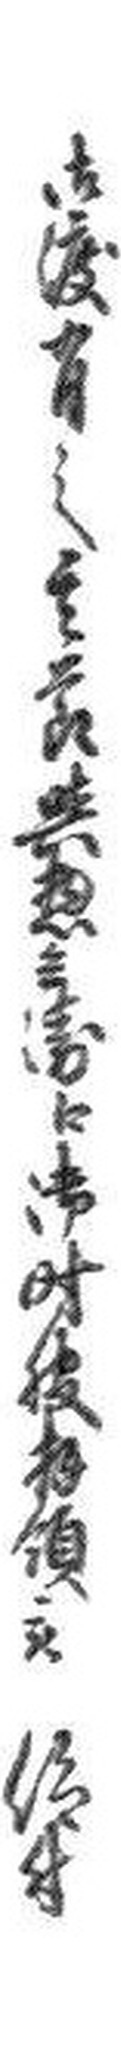御渡有之其節與惣兵衛江御時服拝領被仰付
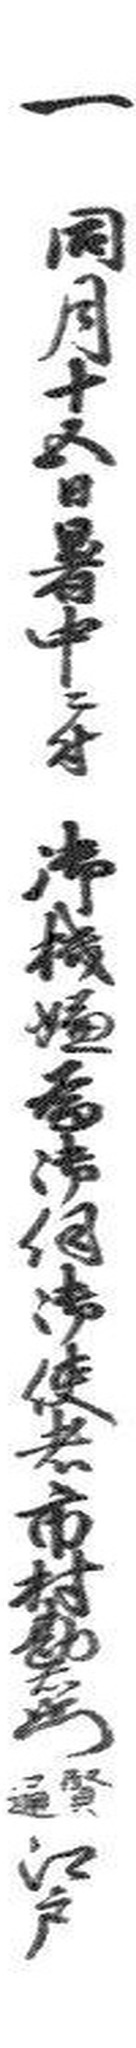一同月十五日暑中ニ付御機嫌為御伺御使者市村勘右衛門賢通江戸
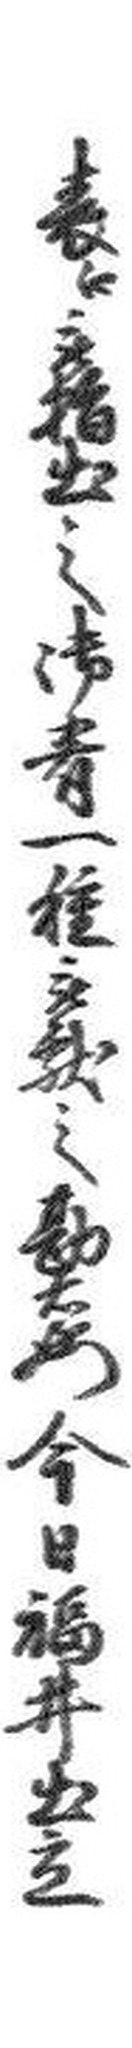表江被指出之御肴一種被献之勘右衛門今日福井出立
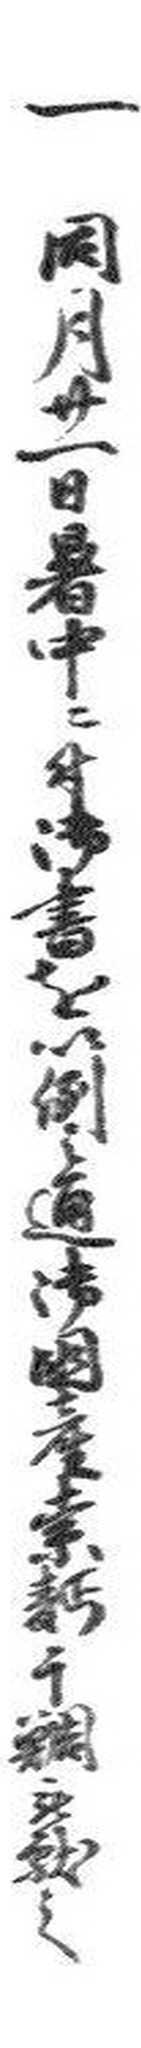一同月廿一日暑中ニ付御書を以例之通御国産索麺干鯛被献之
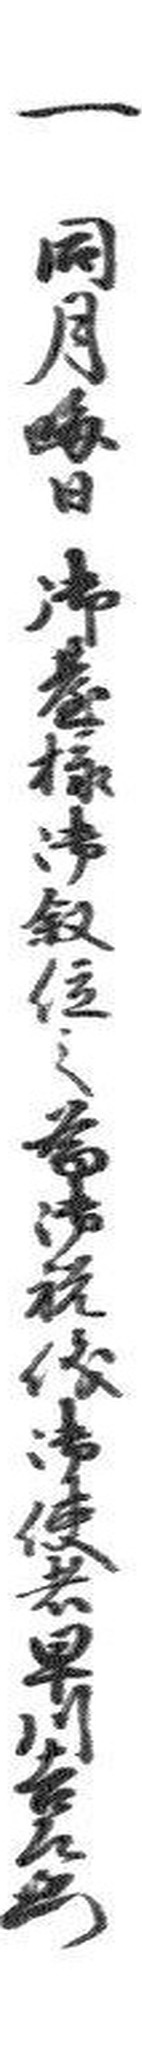一同月晦日御台様御叙位之為御祝儀御使者早川吉左衛門
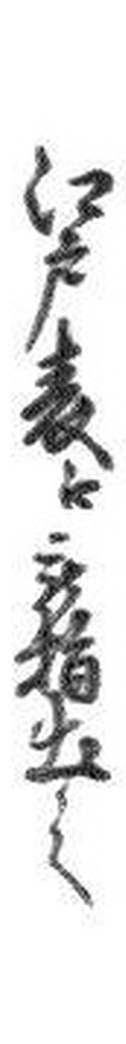江戸表江被指出之
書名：家譜 二十五 吉品公 従宝永六年到同七年
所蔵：福井県文書館 Fukui Prefectural Archives
